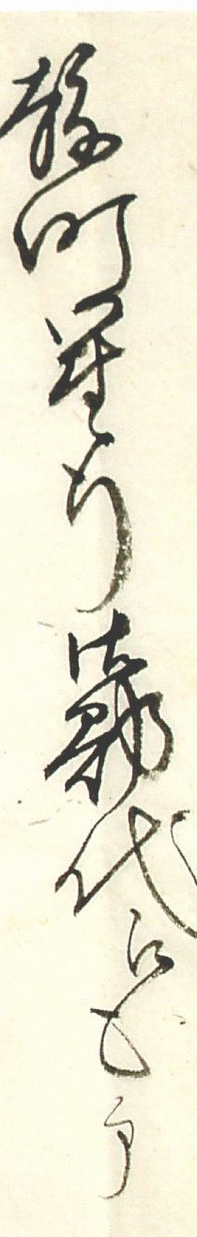趣町御奉行御郡代えも被申
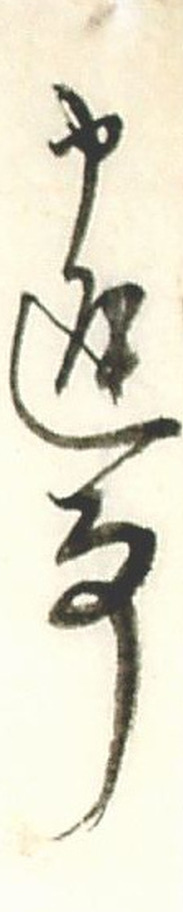申達事
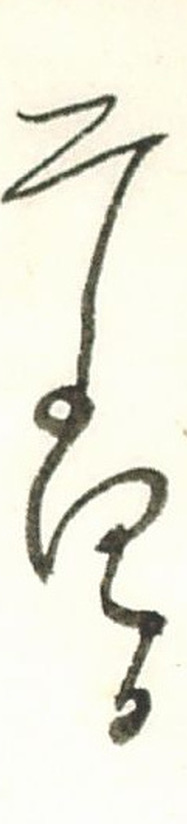二月四日
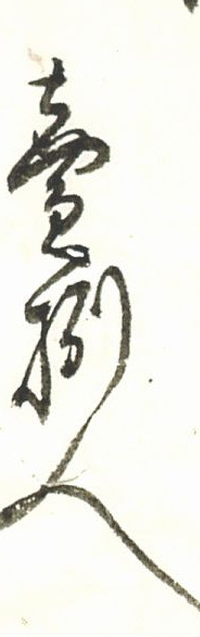売捌人
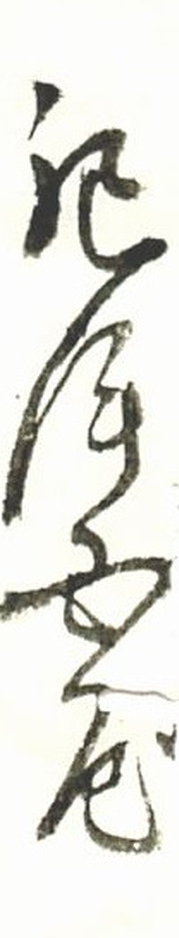紀伊国屋
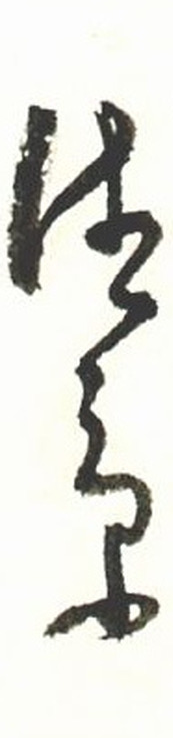徳兵衛
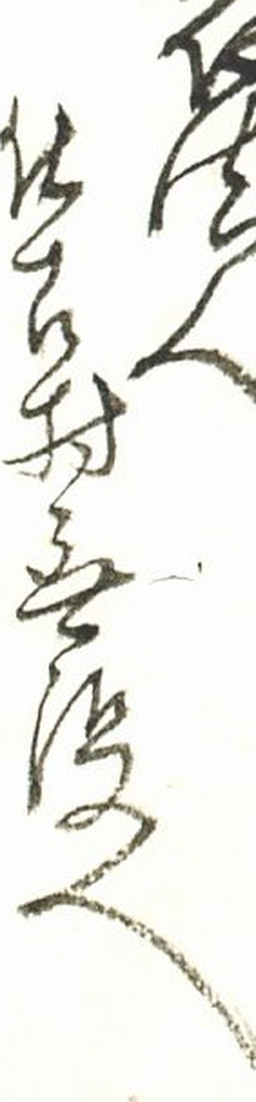佐古村郷役人
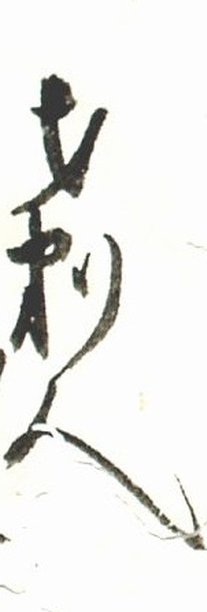才判人
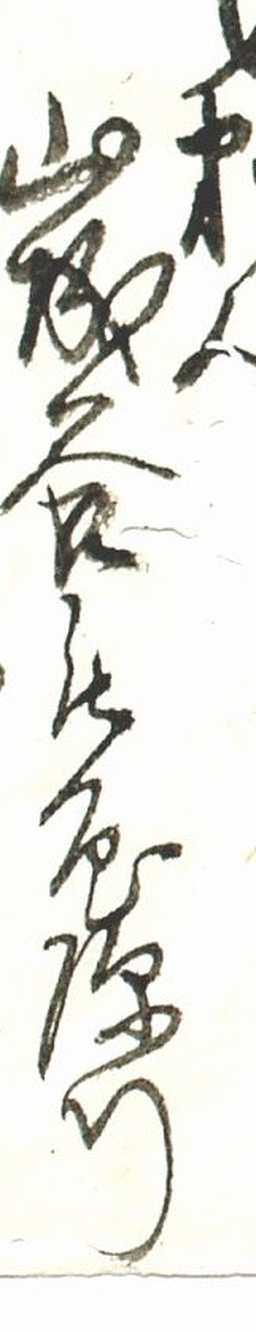山城谷庄屋深川
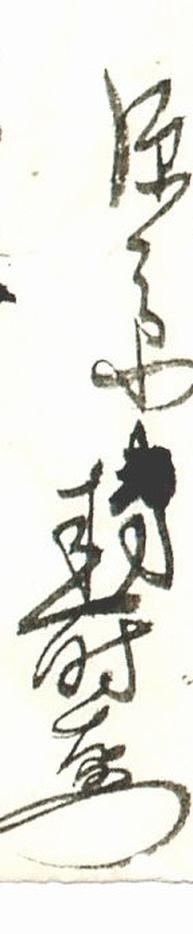源兵衛方
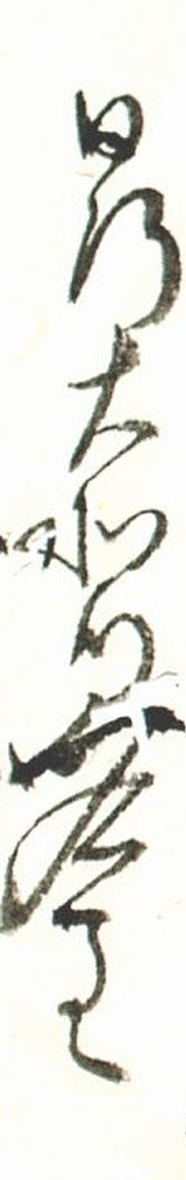同断大和川内名主
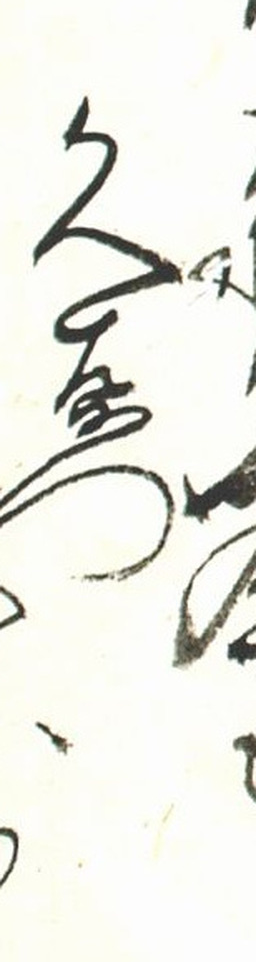久左衛門
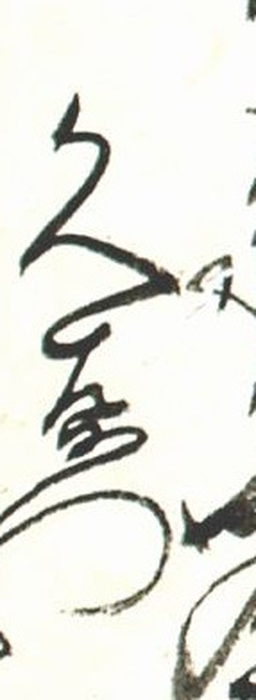久左衛門
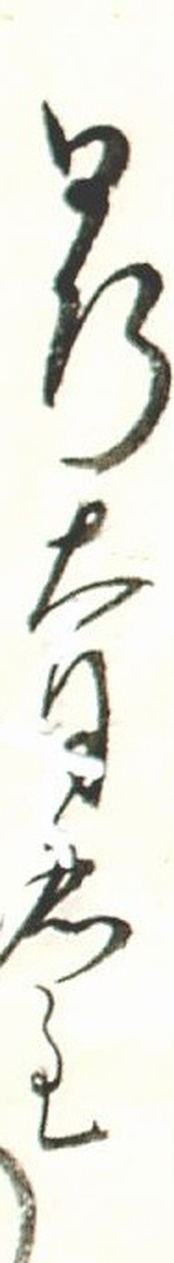同断大付名主
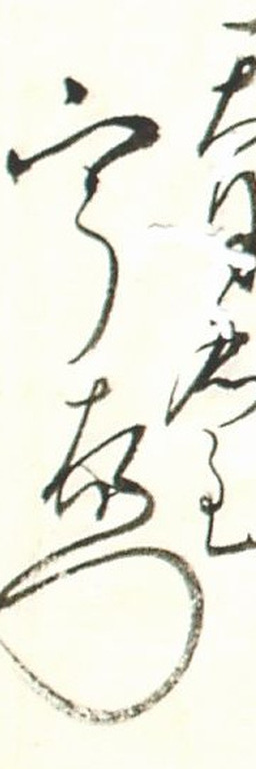宇左衛門
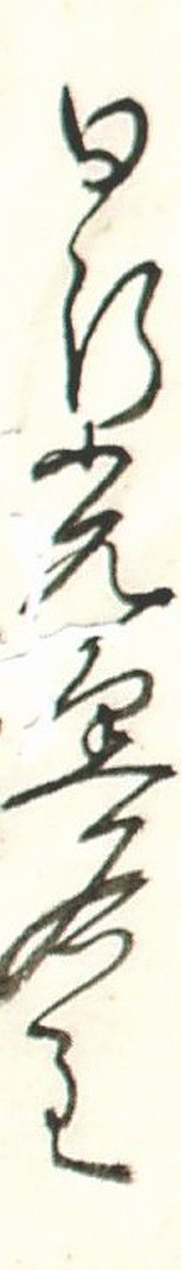同断大付名主
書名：申上覚（漆からろう製成及売捌きについて）
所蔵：鳴門教育大学 Naruto University of Education
